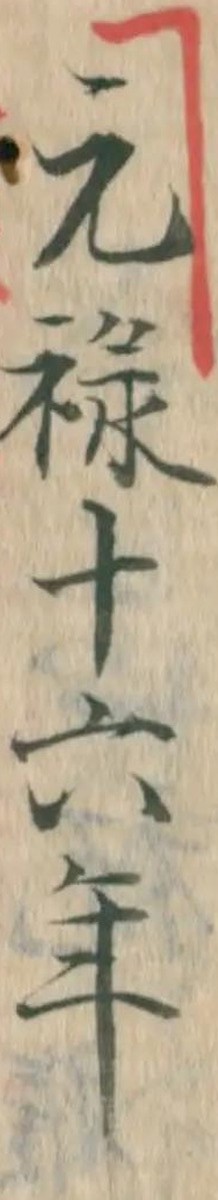元禄十六年
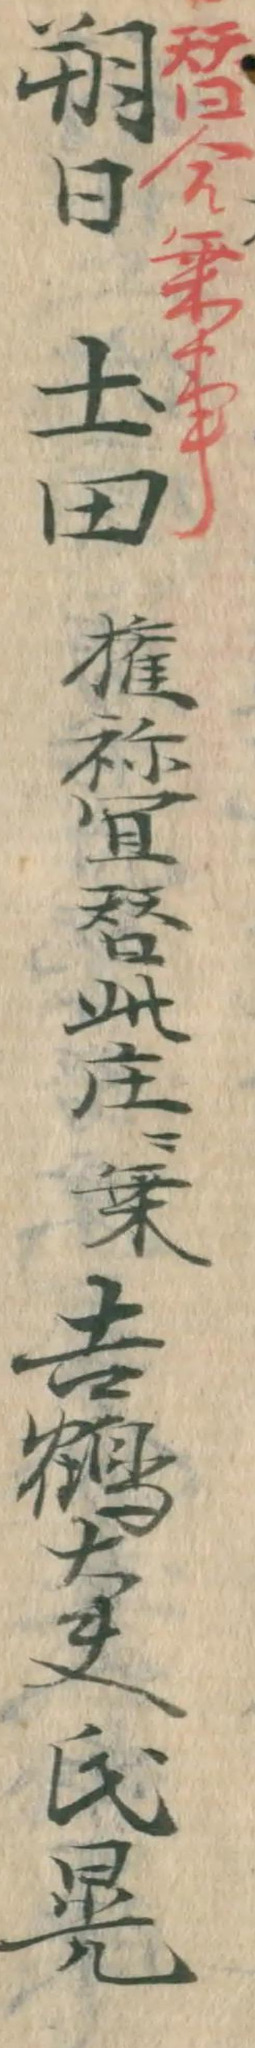朔日土田権祢宜替此庄ニ乗吉鶴大夫氏晃
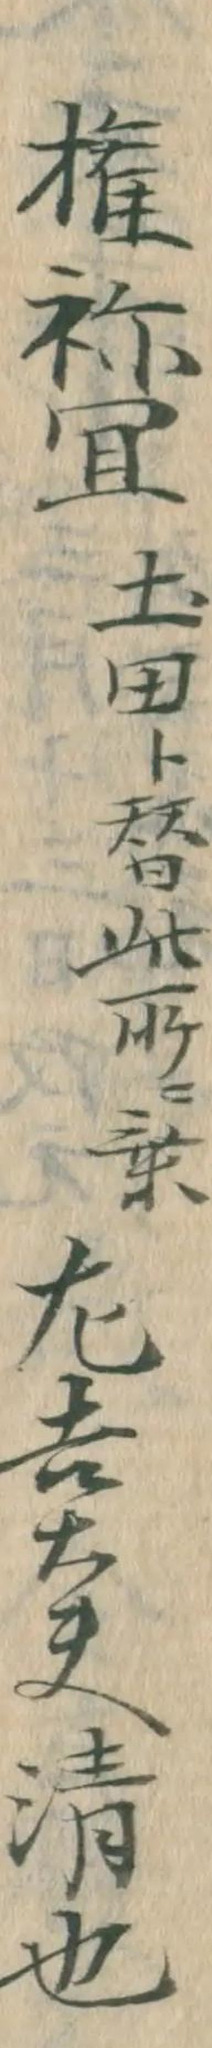権祢宜土田ト替此所ニ乗左吉大夫清也

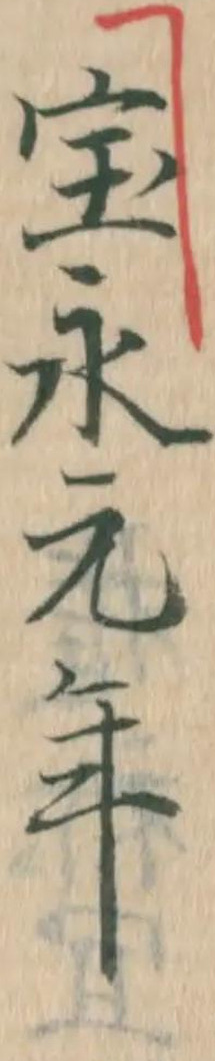宝永二年
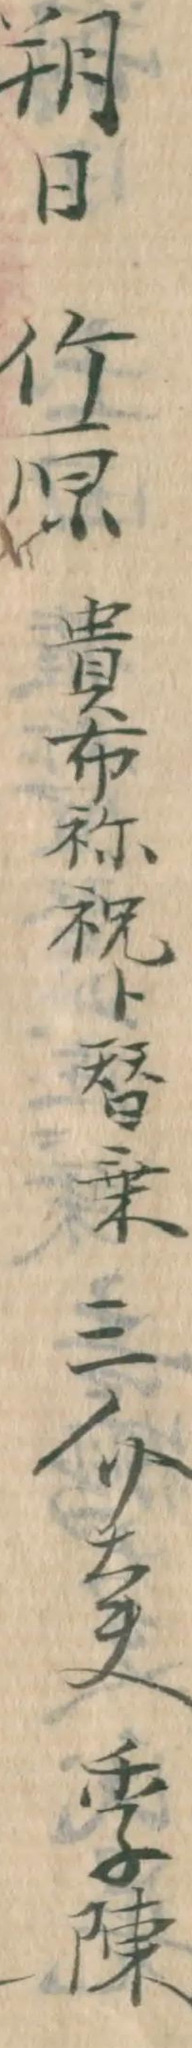朔日竹原貴布祢祝ト替乗三介大夫季陳
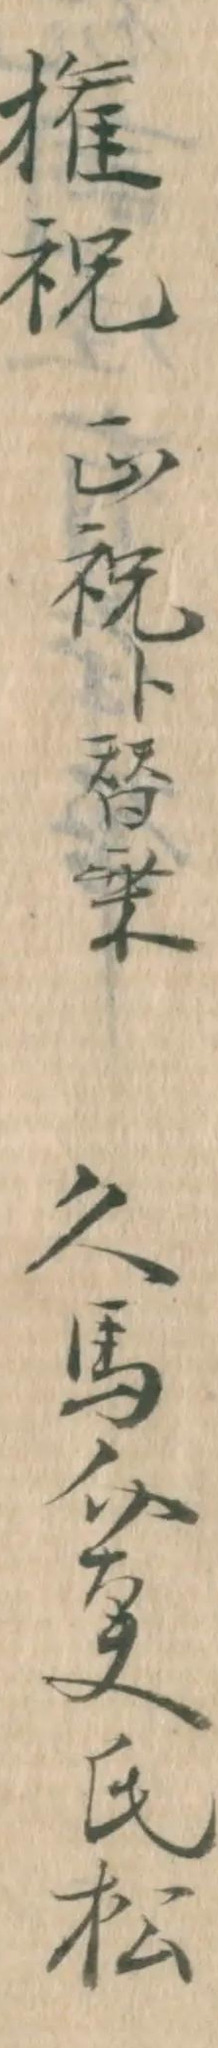権祝正祝ト替乗久馬介大夫氏松
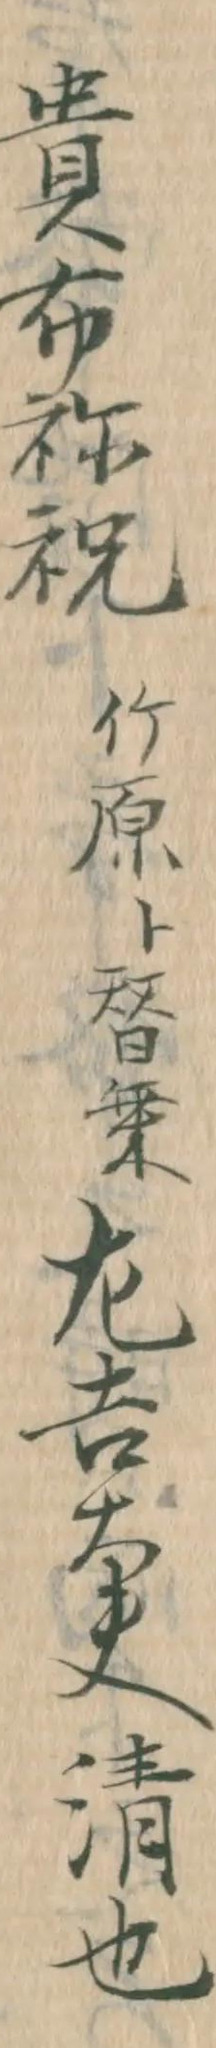貴布祢祝竹原ト替乗左吉大夫清也
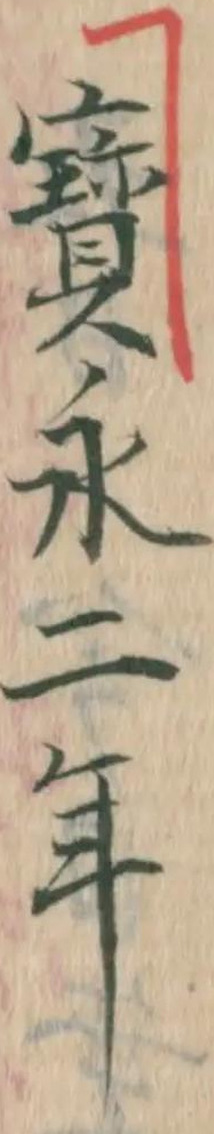宝永二年
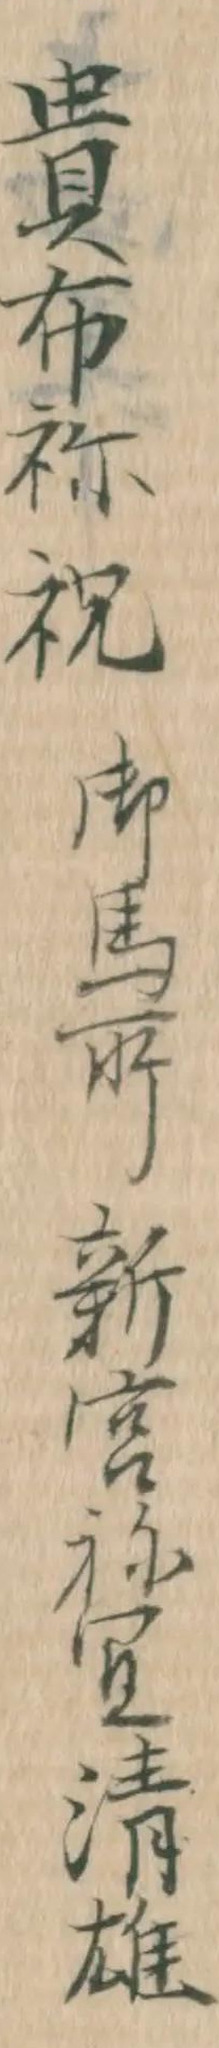貴布祢祝御馬所新宮祢宜清雄
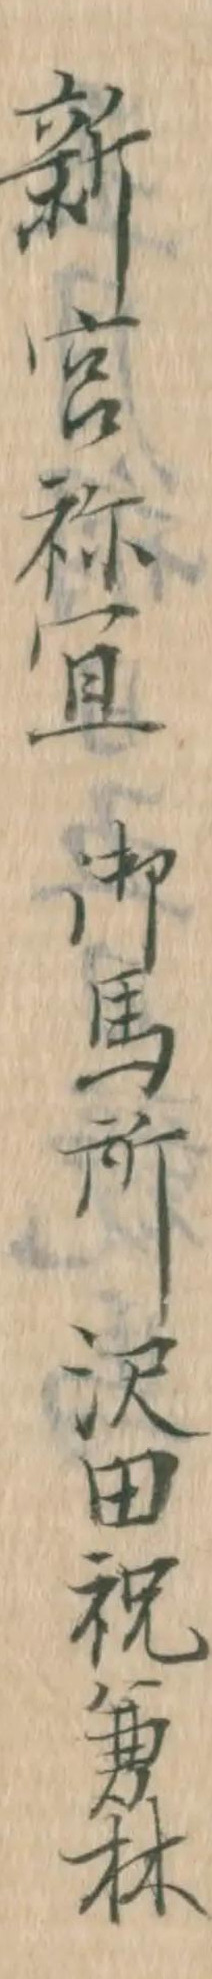新宮祢宜御馬所沢田祝兼林
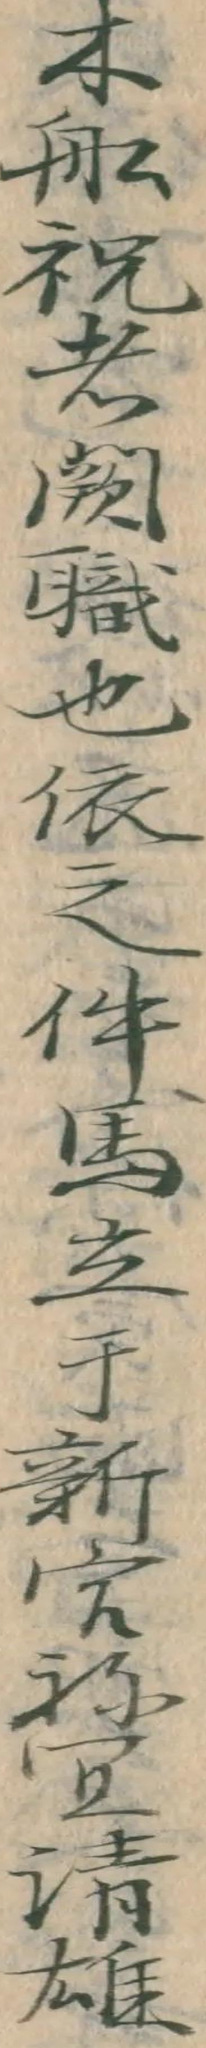木船祝者闕職也依之件馬立于新宮祢宜清雄
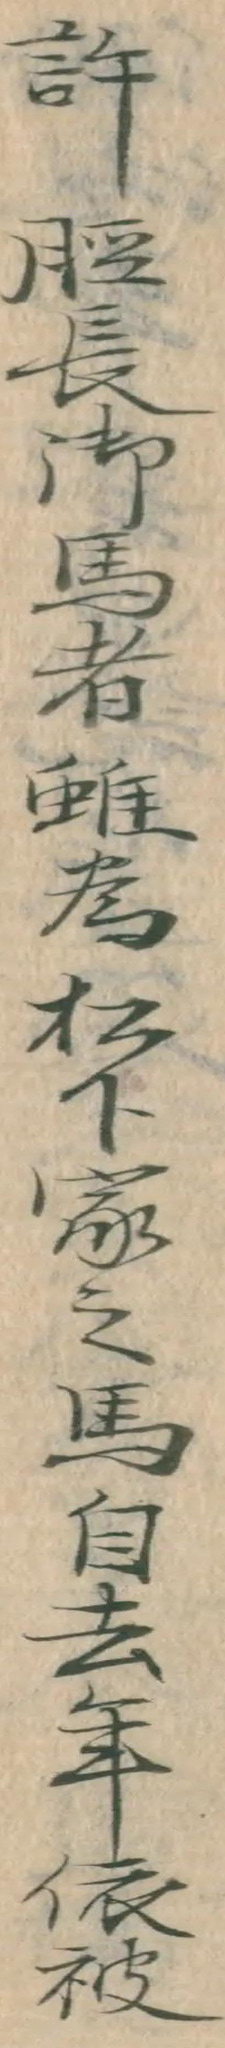許脛長御馬者雖為松下家之馬自去年依被
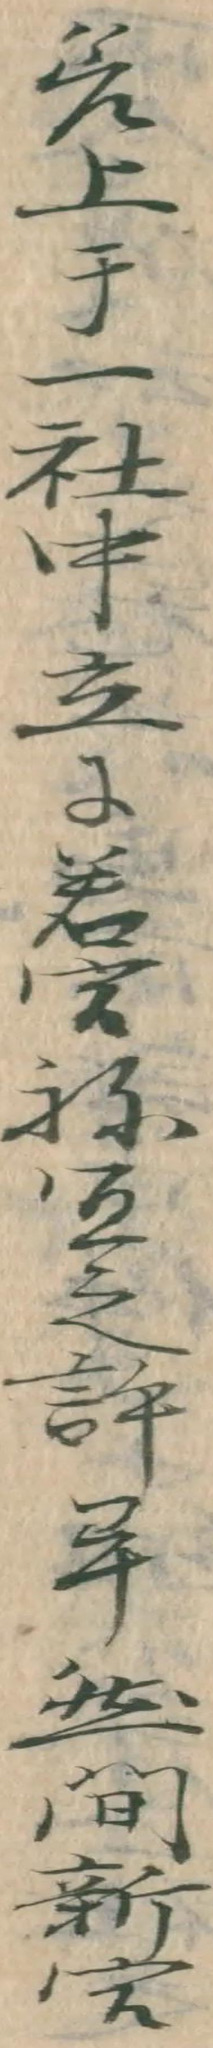差上于一社中立に若宮祢宜之許畢然間新宮
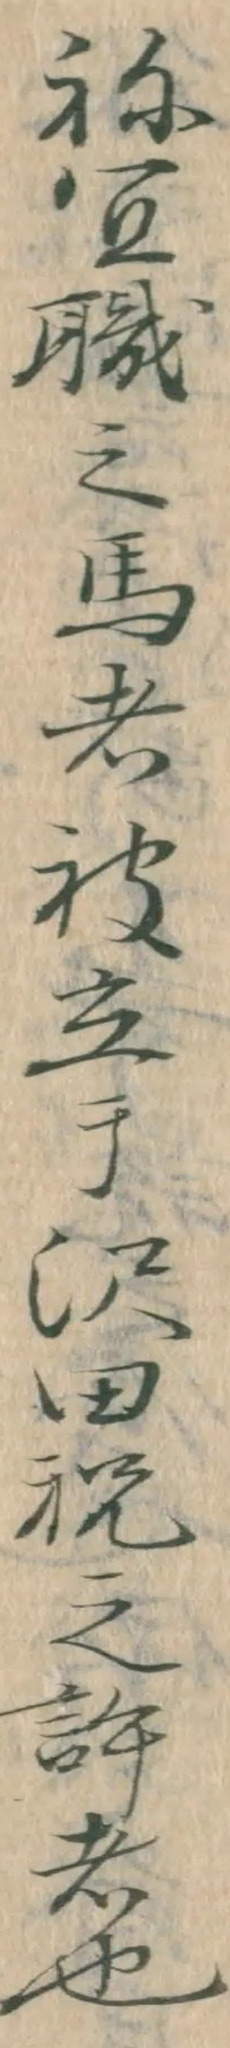祢宜職之馬者被立于沢田祝之許者也
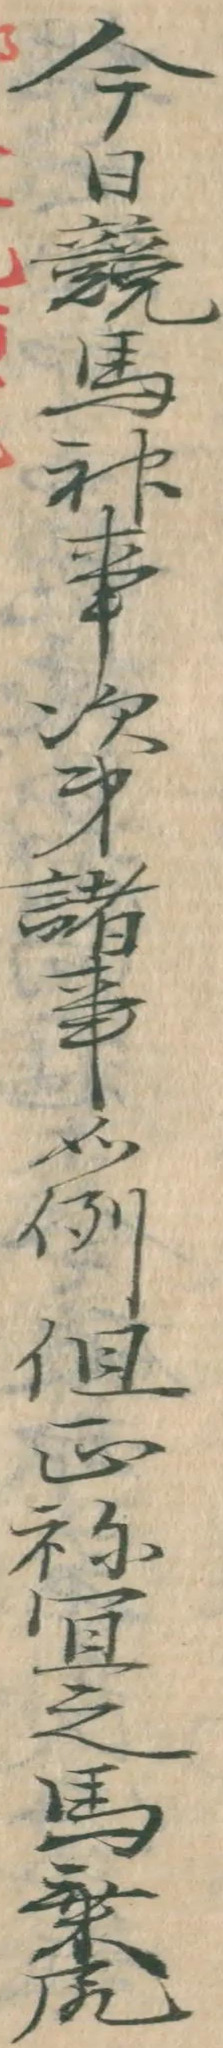今日競馬神事次第諸事如例但正祢宜之馬乗尻
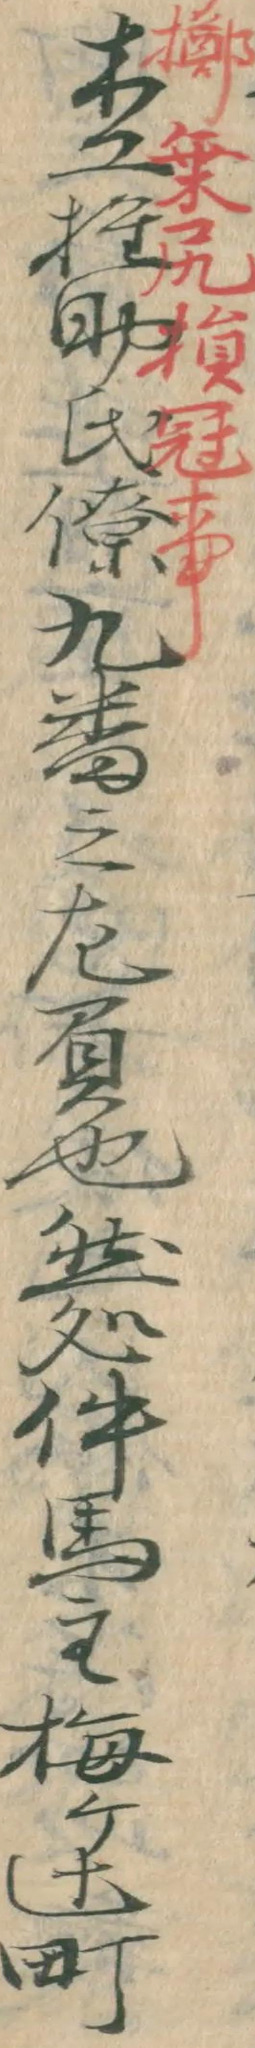木工権助氏僚九番之左負也然処件馬主梅ケ辻町
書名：賀茂社記録. 第10冊
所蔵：国立国会図書館 National Diet Library, JAPAN
